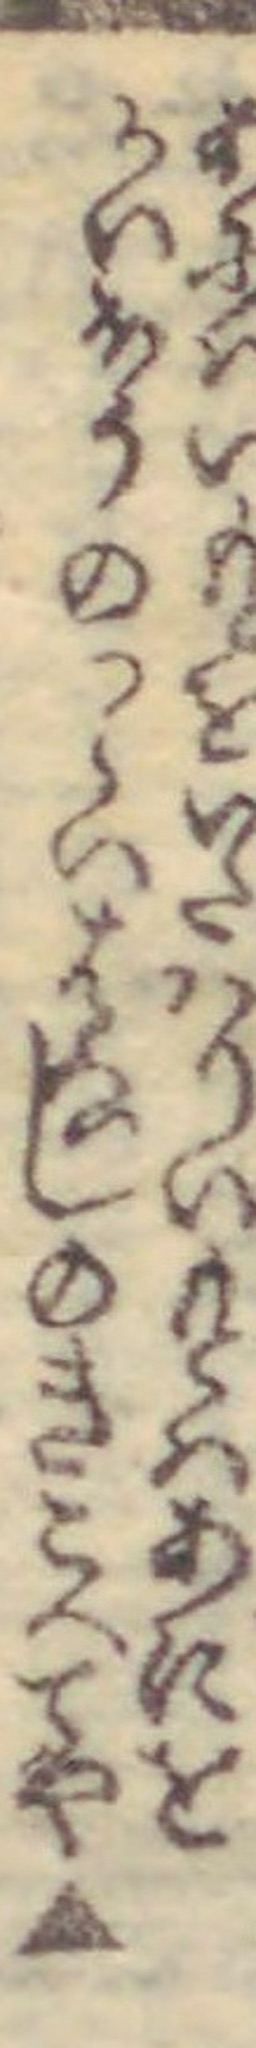かいほうのつらいはなしのきこへてや▲
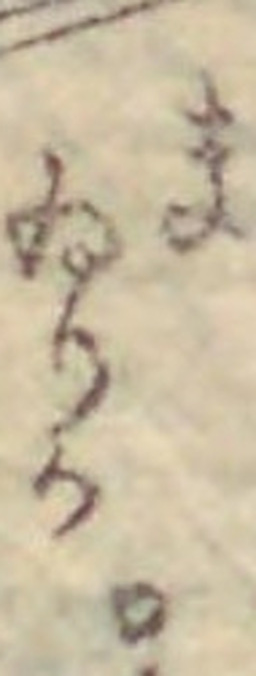ゐりか
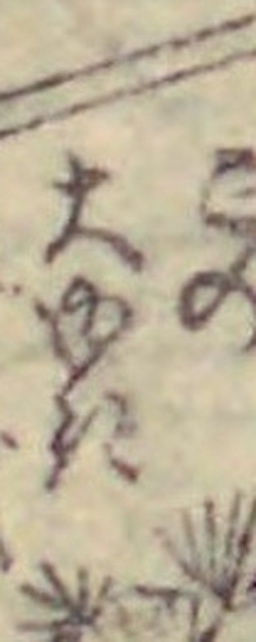大ゆき
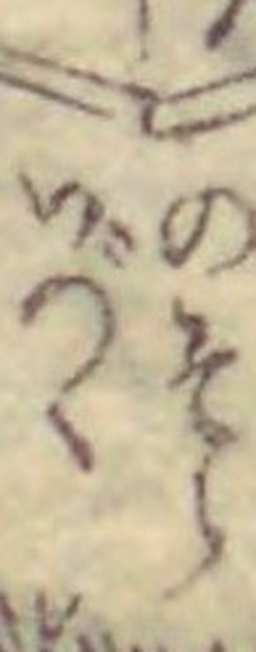いづく
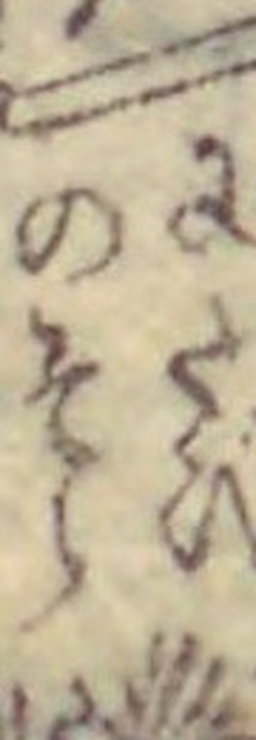のそら
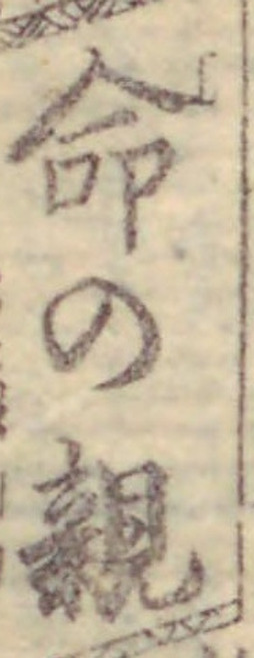命の親
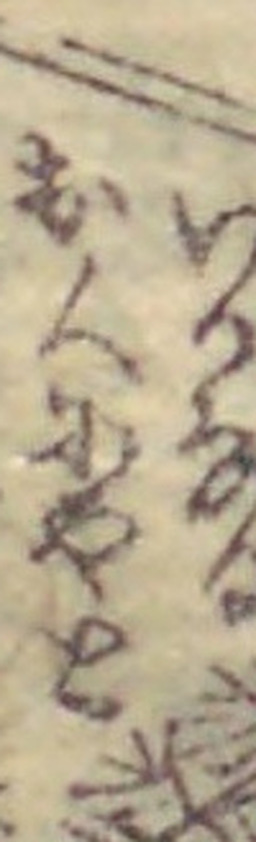お人にやと
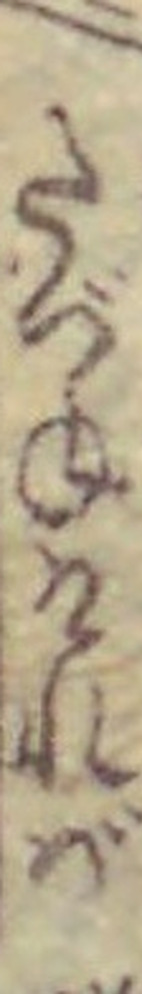たづねければ

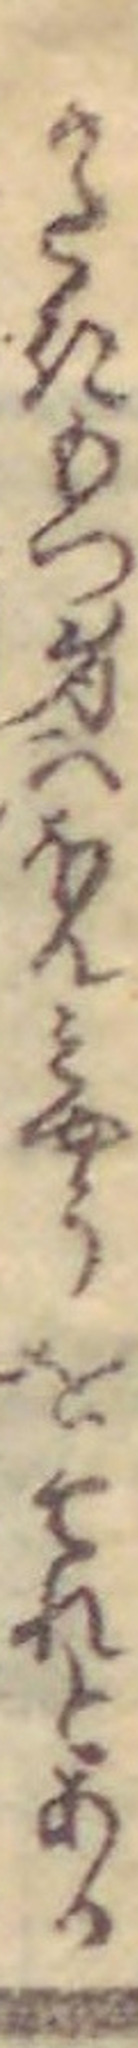かたきもつ身はほんみやうをそれとあか
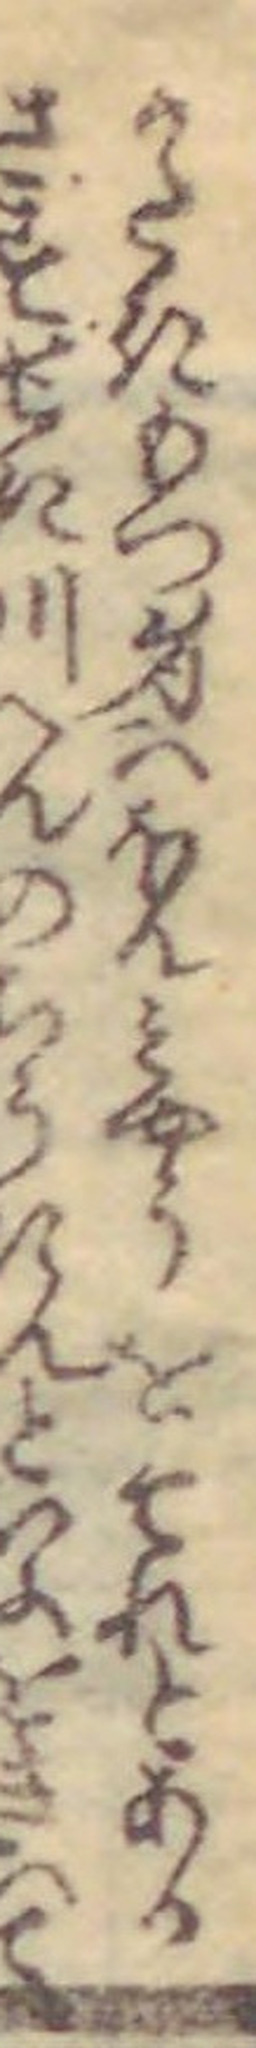さすせき川へんのらうにんといふをきいて
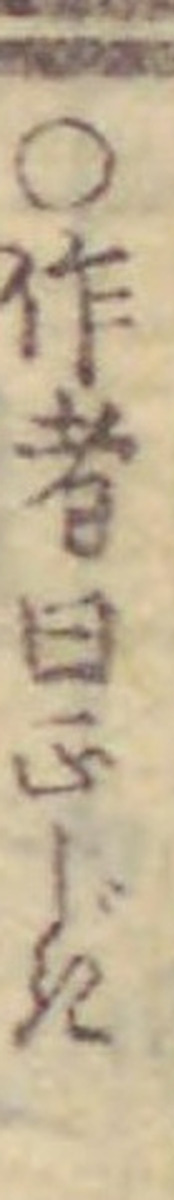○作者曰正じき
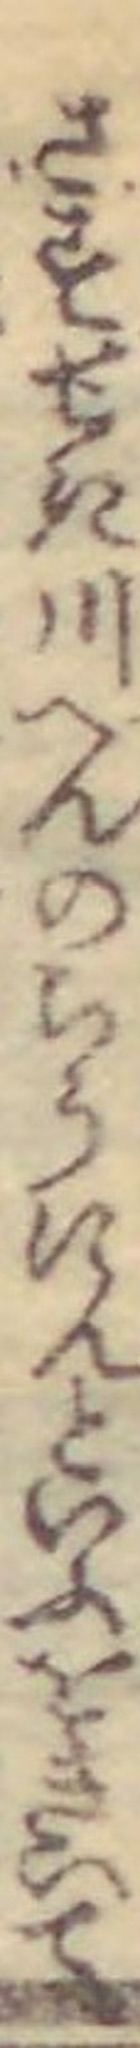さすせき川へんのらうにんといふをきいて
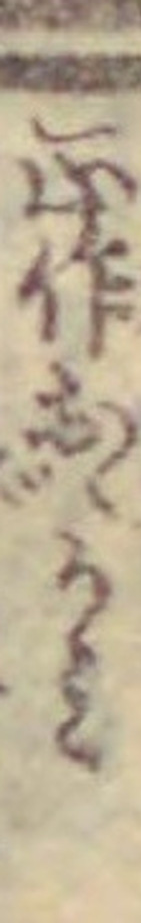正作おゝかみ
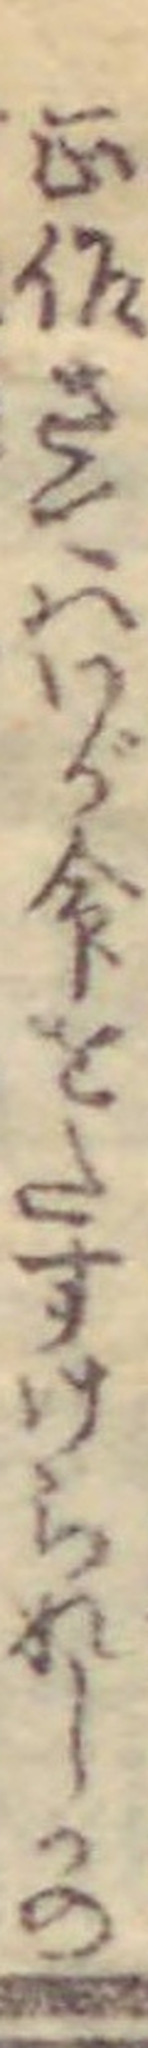正作さてはわが命をたすけられしかの
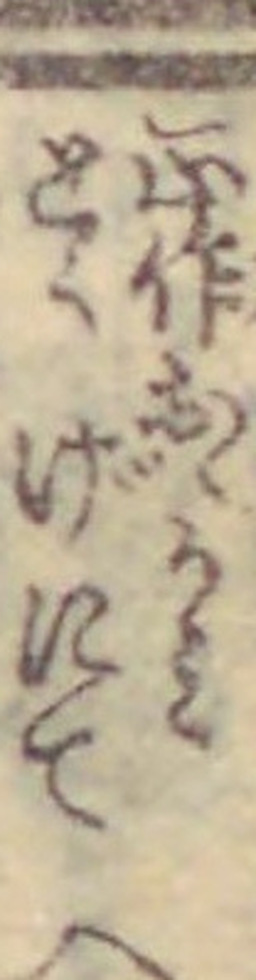とうげにて
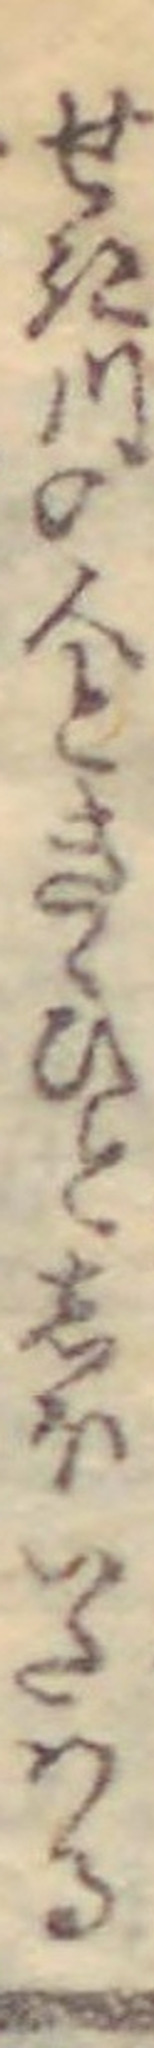せき川の人ときゝひとしほいたはる
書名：八ツ目鱣因縁物語 3巻
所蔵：国立国会図書館 National Diet Library, JAPAN
